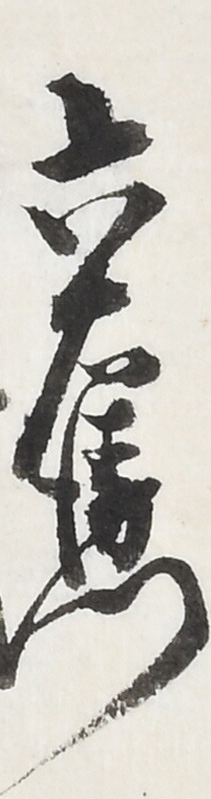六右衛門
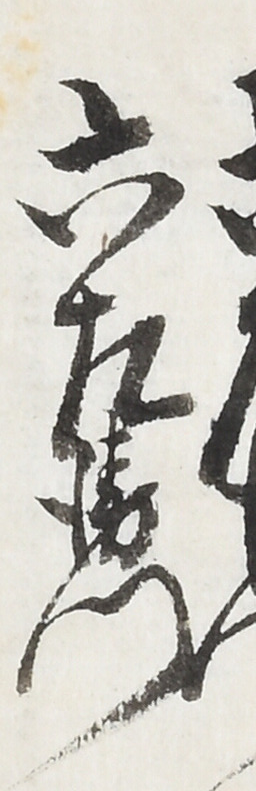六右衛門
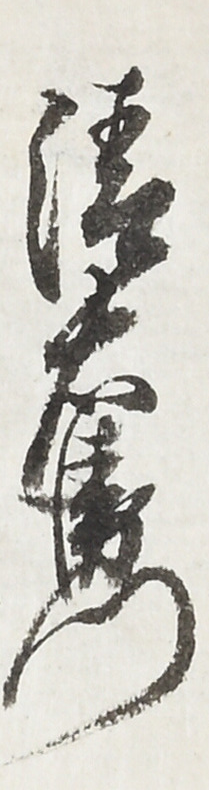清右衛門

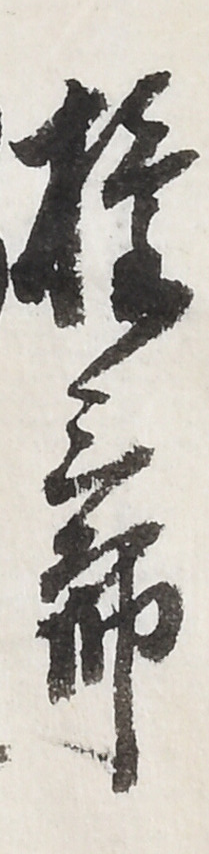権三郎
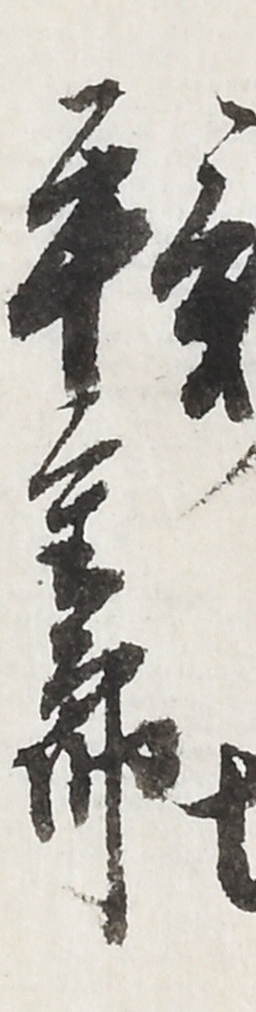平重郎
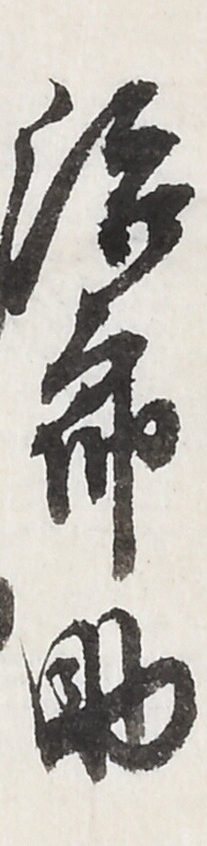治郎助
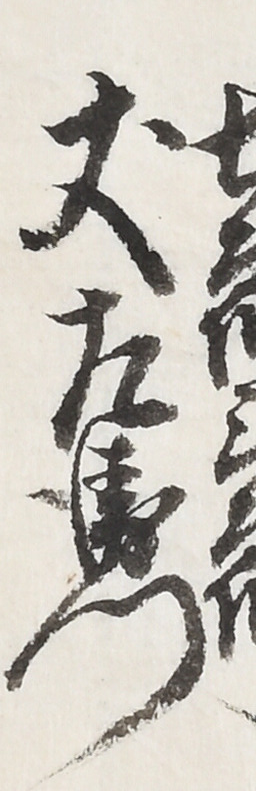丈左衛門
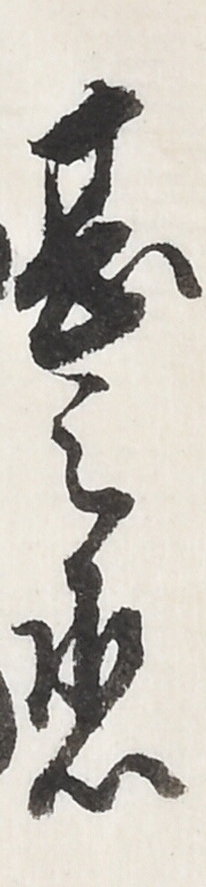甚之丞
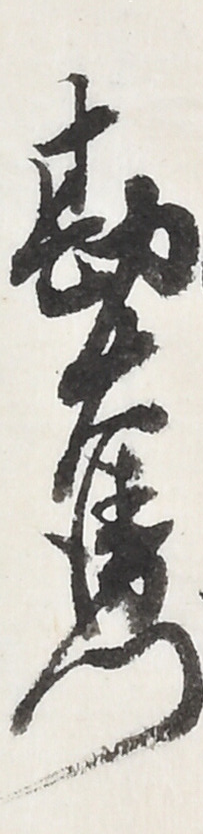藤右衛門
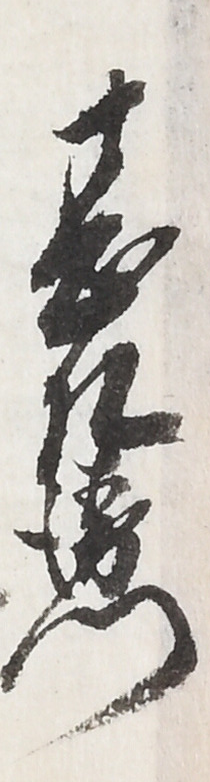甚左衛門
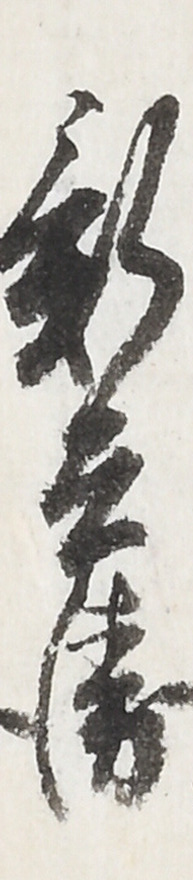利兵衛
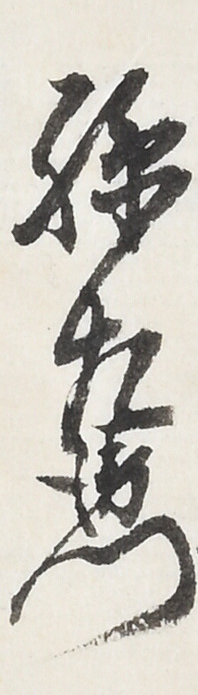孫左衛門
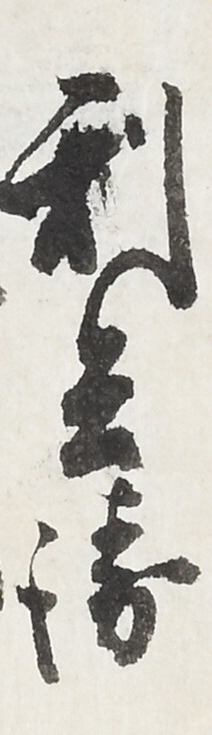利兵衛
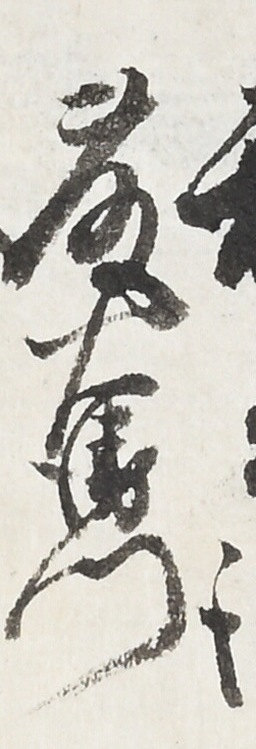藤右衛門
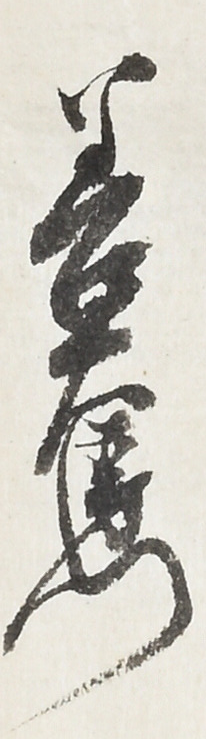善右衛門

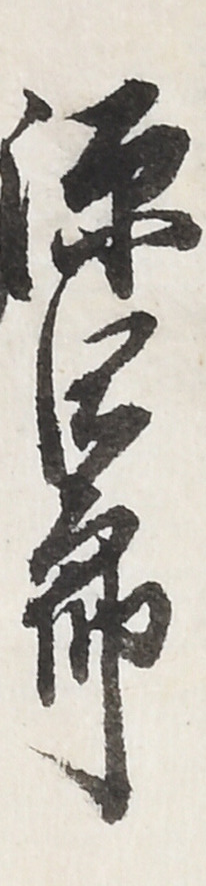源四郎
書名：御拝地百五拾年御祝儀献上御目録名前
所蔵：伊那市立高遠町図書館・合同会社AMANE
